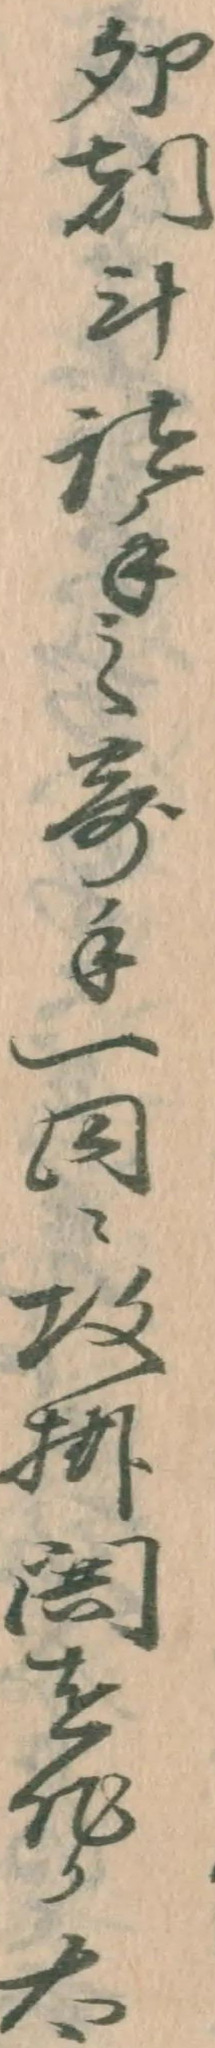夘刻斗諸手之寄手一同に攻掛鬨を作り太
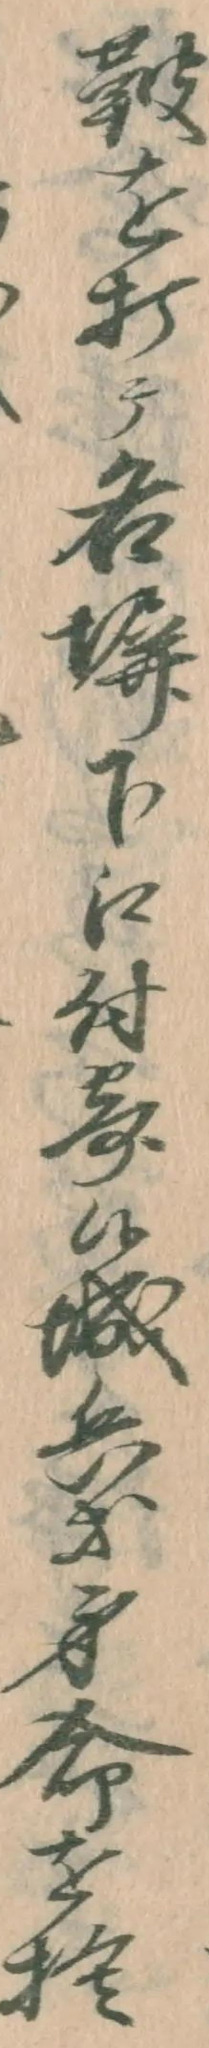皷を打て各塀下江付寄候城兵等身命を捨
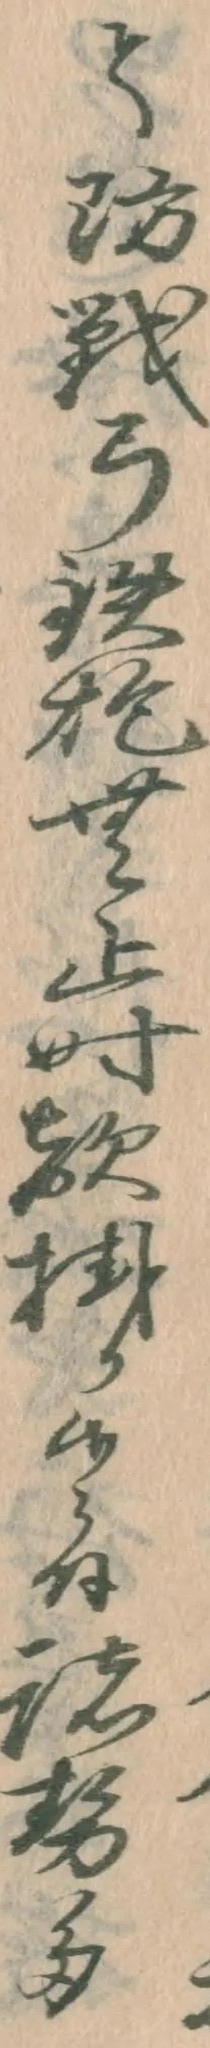て防戦弓鉄炮無止時敵掛り候に付諸勢多
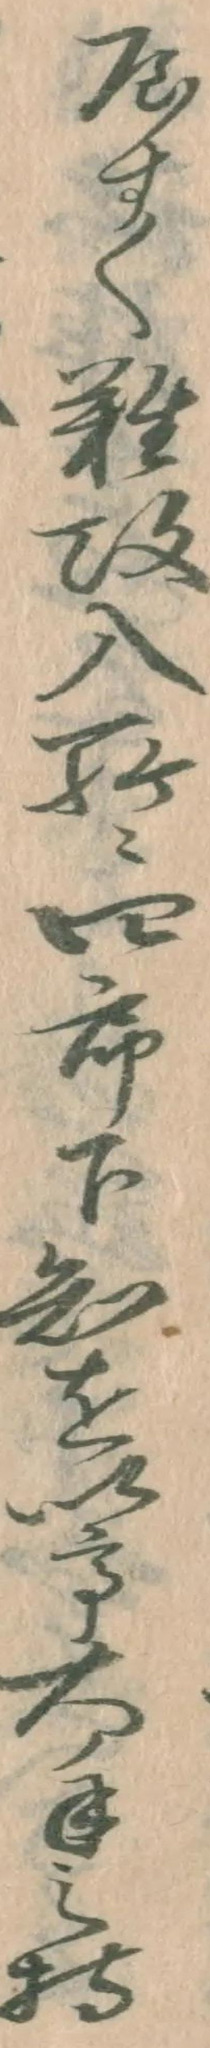屋す〳〵難攻入所に四郎下知を以亭大手之持
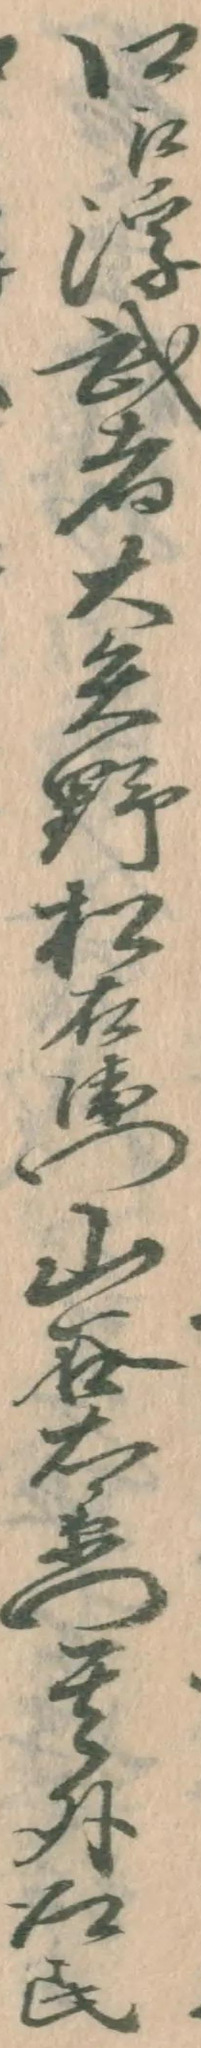口得浮武者大矢野松右衛門山谷右衛門其外郷民
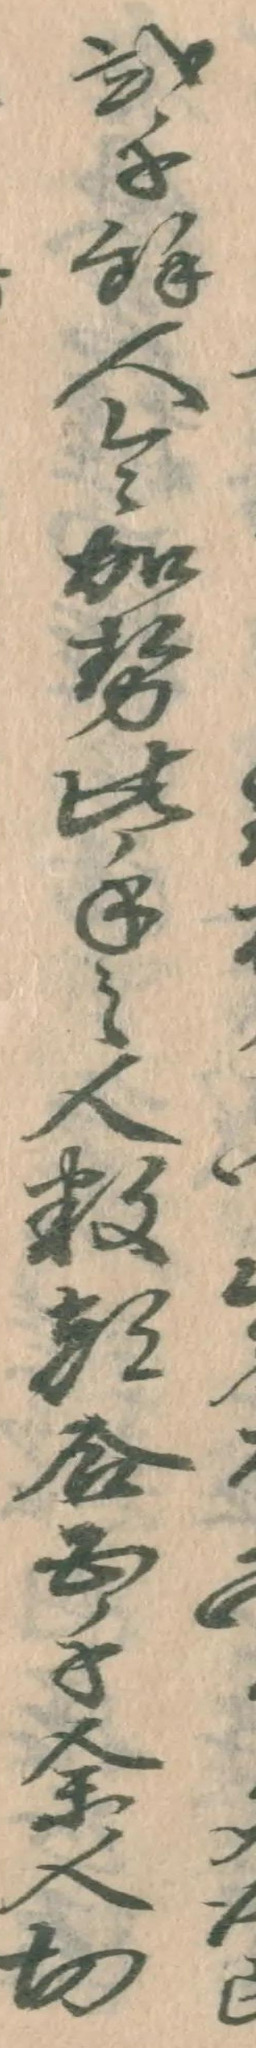弐千余人令加勢此手之人数都合五千余人切
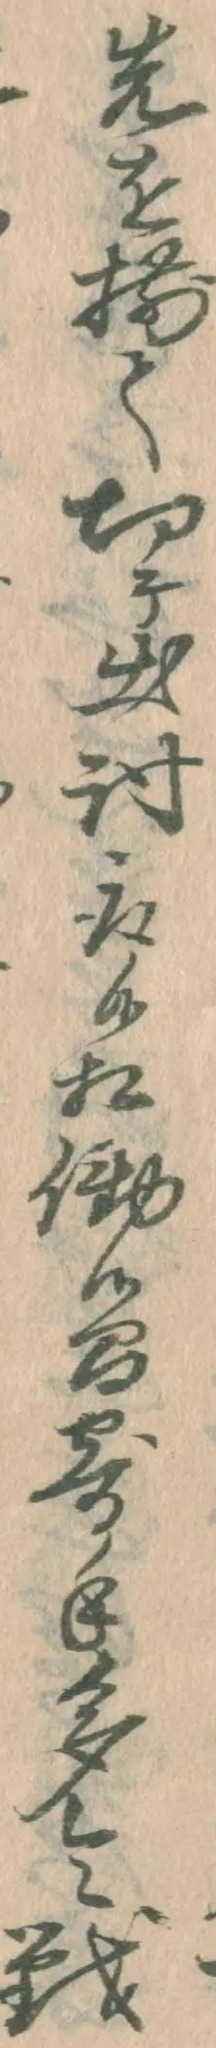先を揃て切て出討取候相働候間寄手多令戦
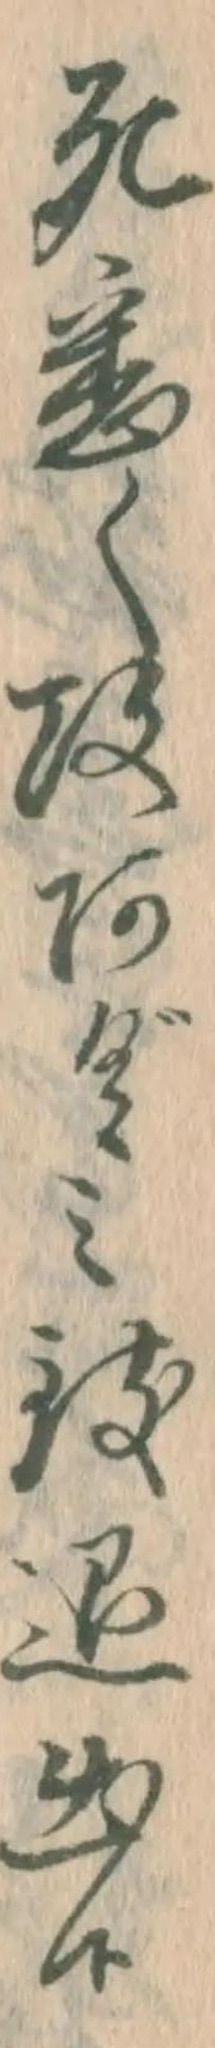死悉く攻阿ぐみ致退出候
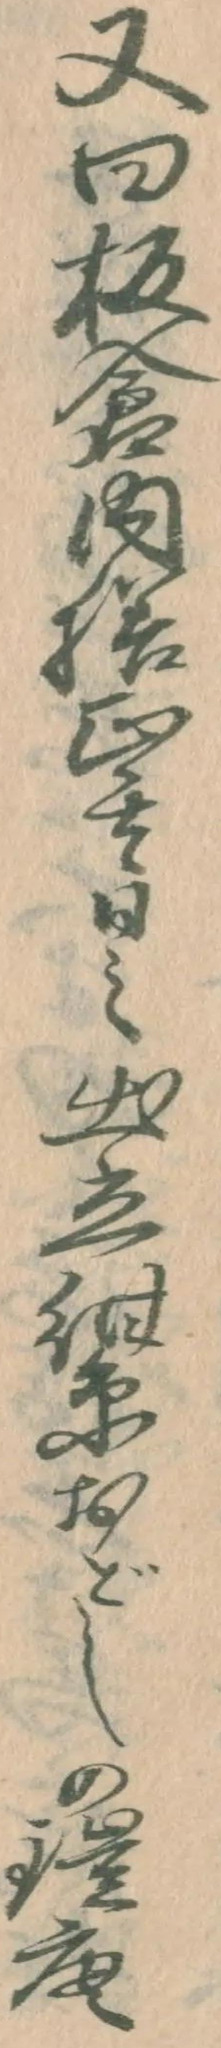又曰板倉内膳正其日之出立紺糸おどしの鎧唐

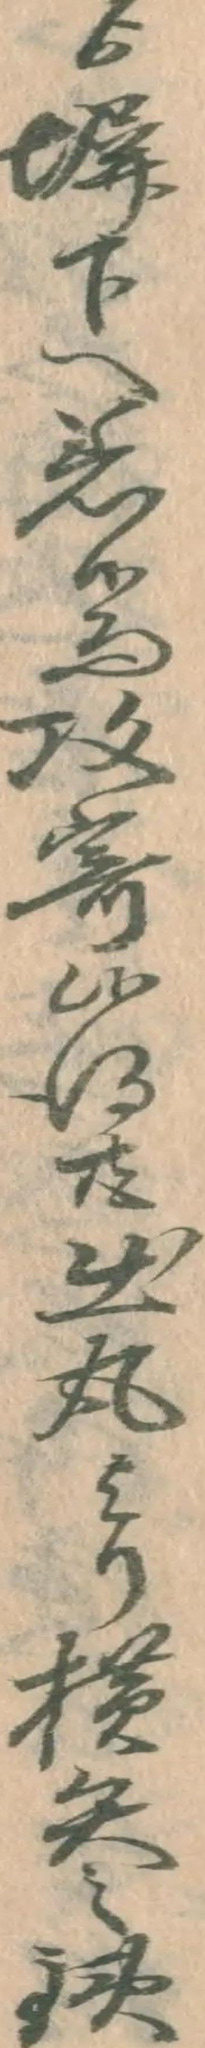ゟ塀下へ着候而攻寄候得共出丸与り横矢之鉄
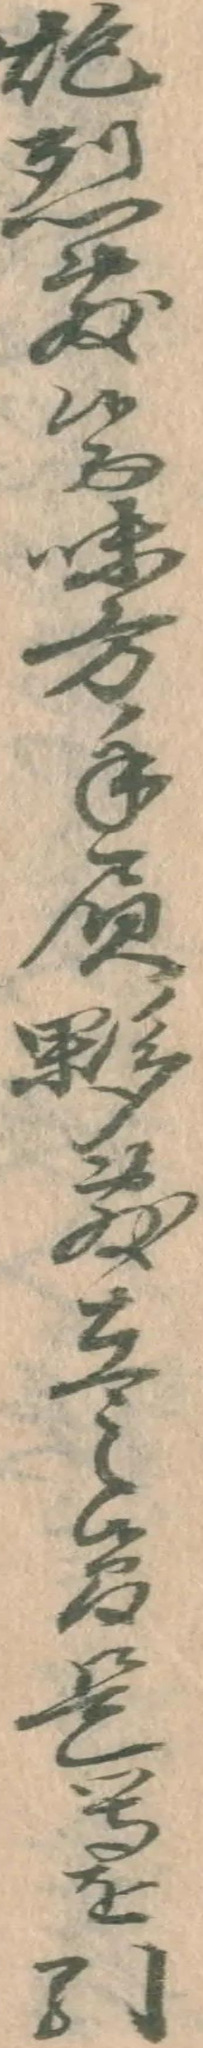炮烈敷候而味方手負夥敷在之候間是等を引
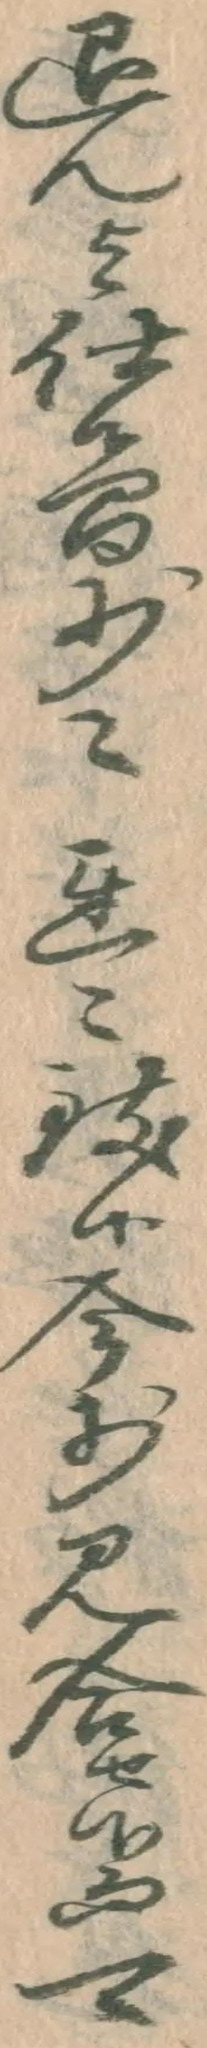退ん与仕候間少々遅々致候今少見合せ候而可
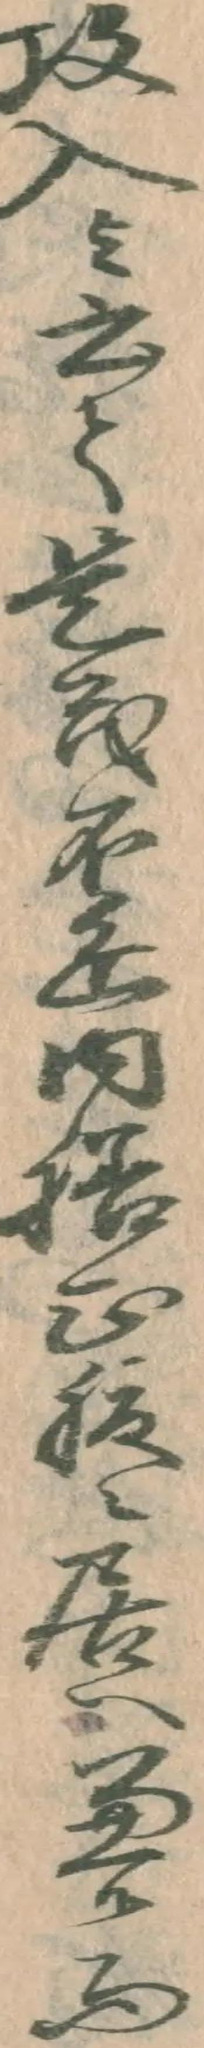攻入与云て是茂不退内膳正腹に居へ兼候而
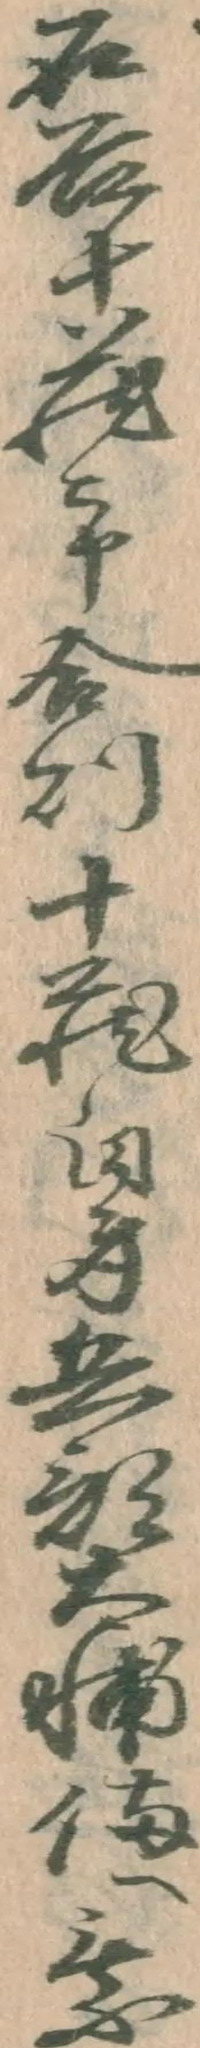石谷十蔵被申合則十蔵自身兵部太輔備へ乗
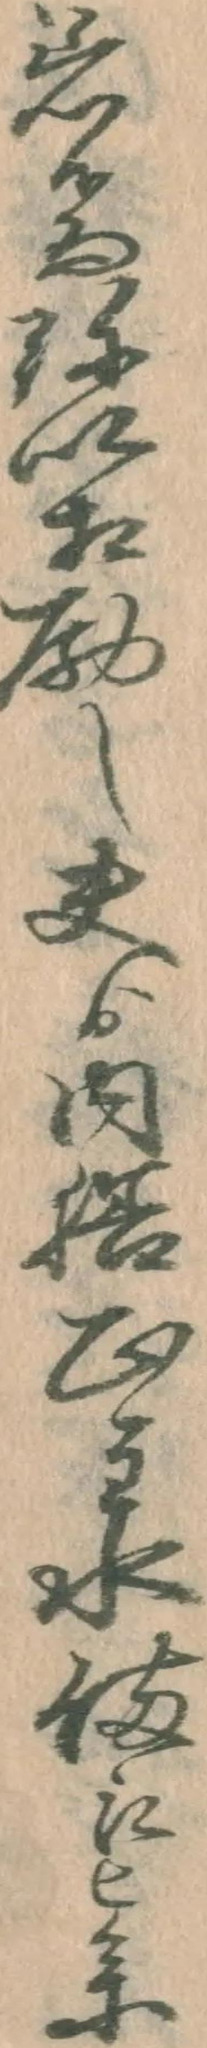着候而弥以相励し夫ゟ内膳正主水備江被参
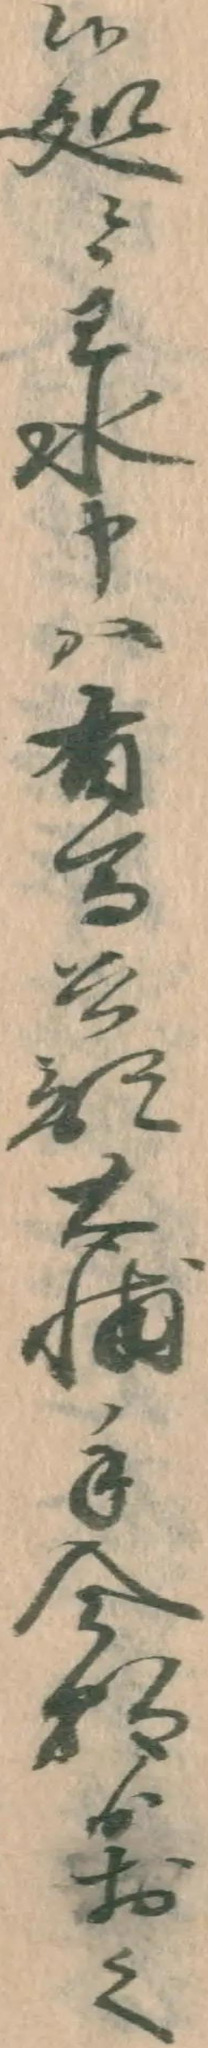候処之主水申は有馬兵部太輔手今朝ゟおく
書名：切支丹御退治記 49巻. [5]
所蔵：国立国会図書館 National Diet Library, JAPAN
